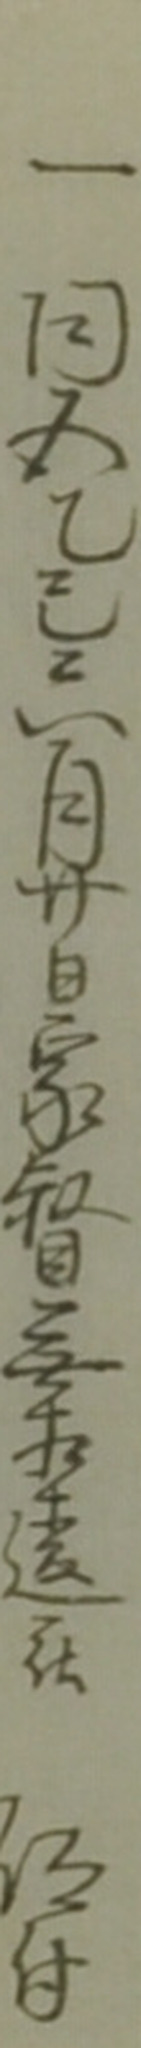一同五乙己六月廿日家督無相違被仰付
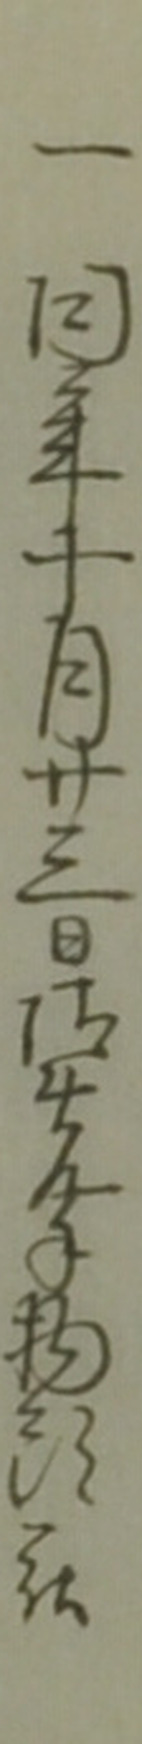一同年十月廿三日御先手物頭被
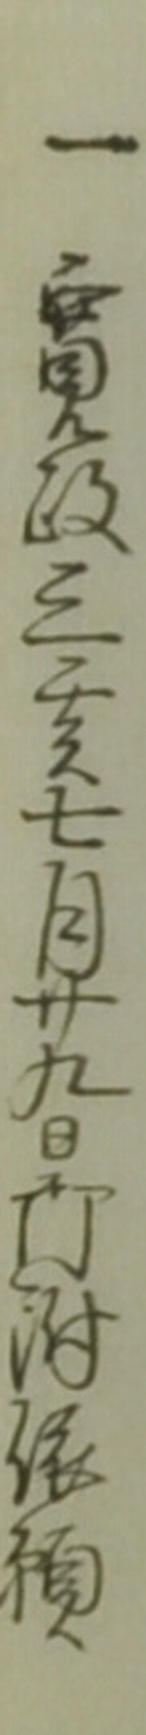一寛政三亥七月廿九日御附依願
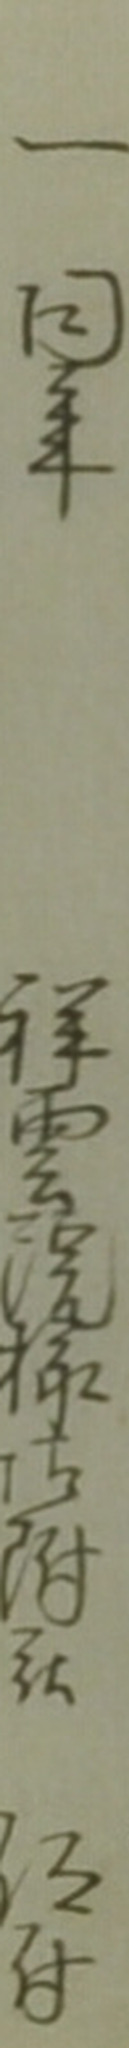一同年祥雲院様御附被仰付

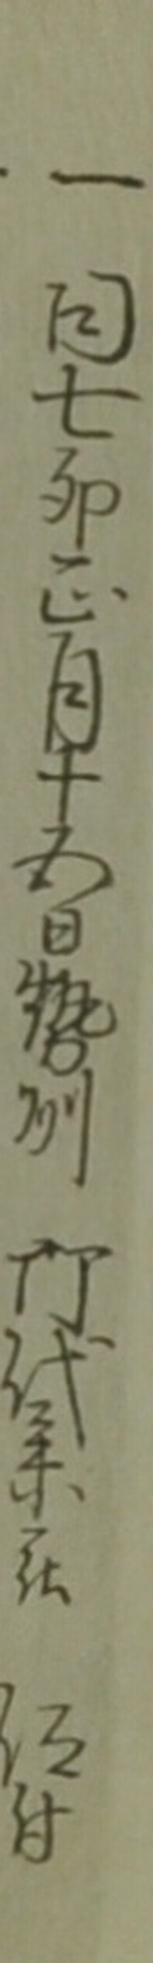一同七卯正月十五日勢州御代参被仰付
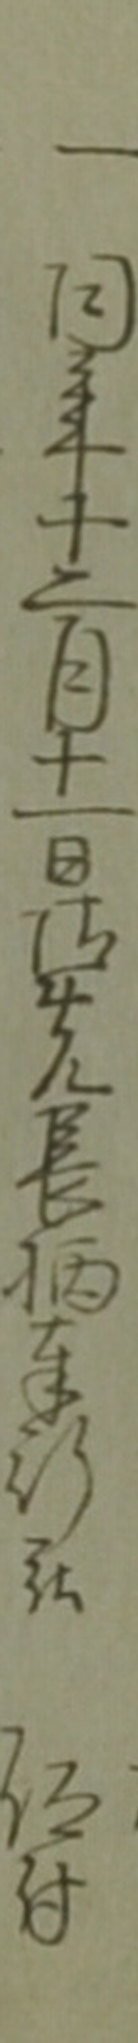一同年十二月十一日御先長柄奉行被仰付
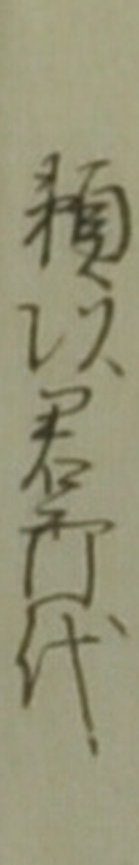頼以君御代
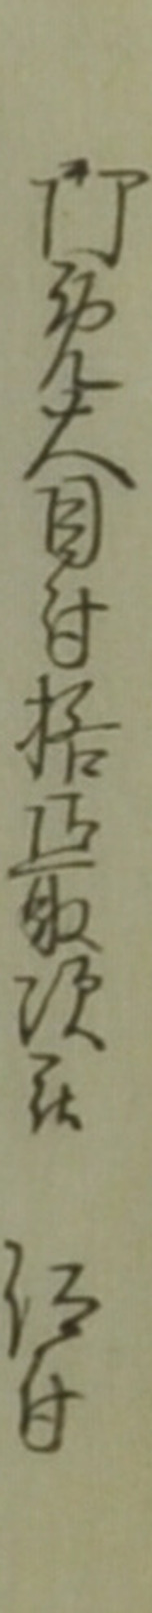御免お大目付格御取次被仰付
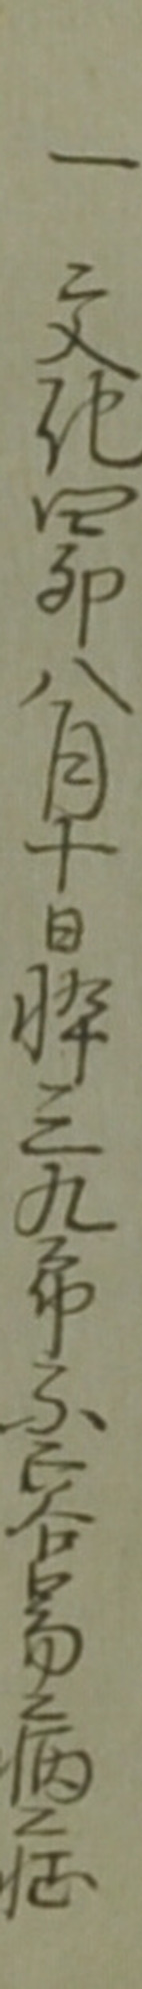一文化四卯八月十日倅三九郎不容易病症
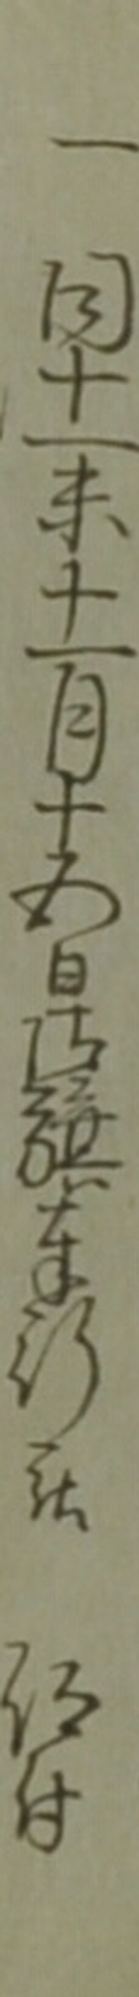一同十一未十一月十五日御旗奉行被仰付
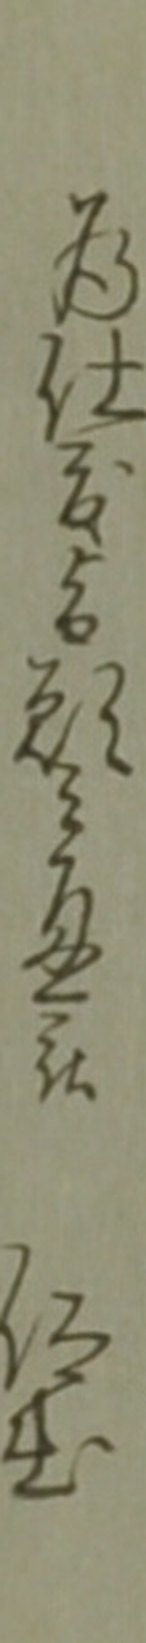為仕度旨願之通被仰出
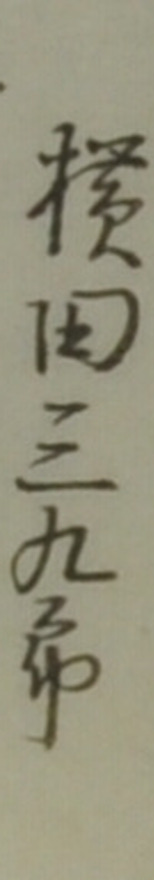横田三九郎
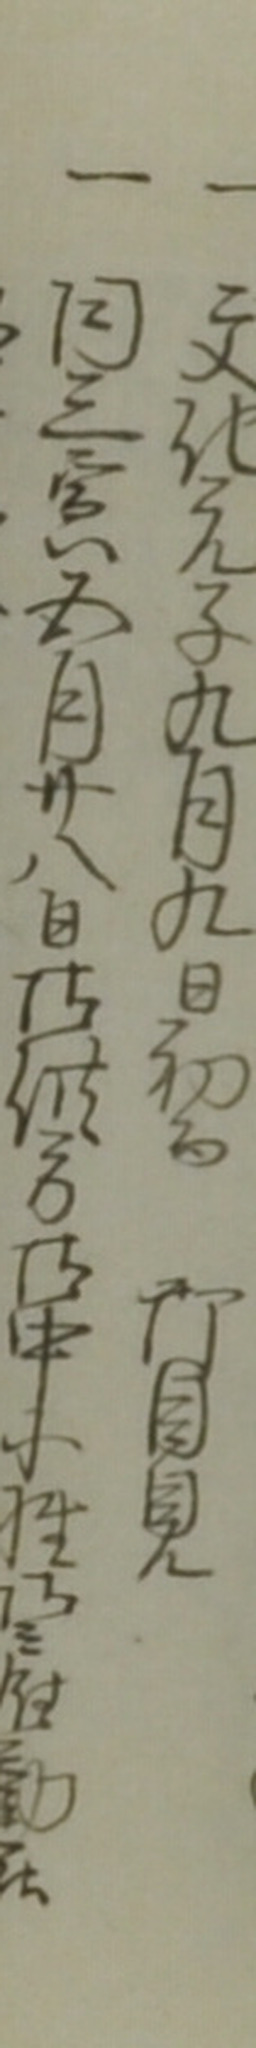一同三寅五月廿八日御供御中小性御雇勤被
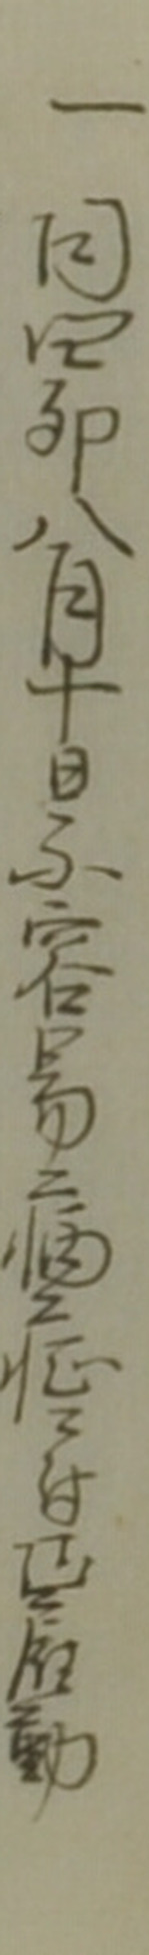一同四卯八月十日不容易病症ニ付御雇勤
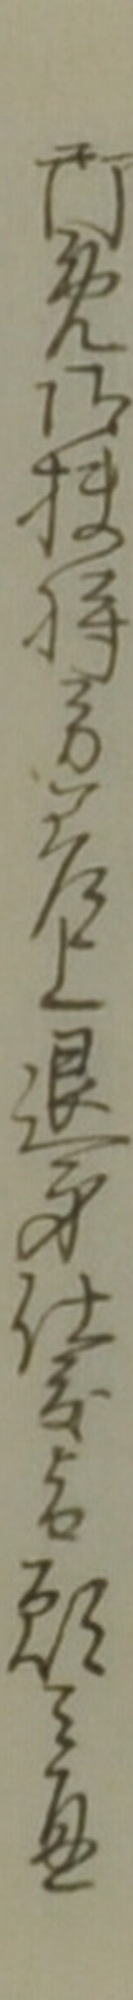御免御扶持方差上退身仕度旨願之通
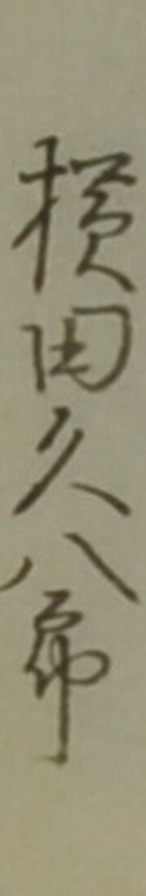横田久八郎
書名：給人諸士勤仕録（三）
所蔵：伊那市立高遠町図書館・合同会社AMANE
